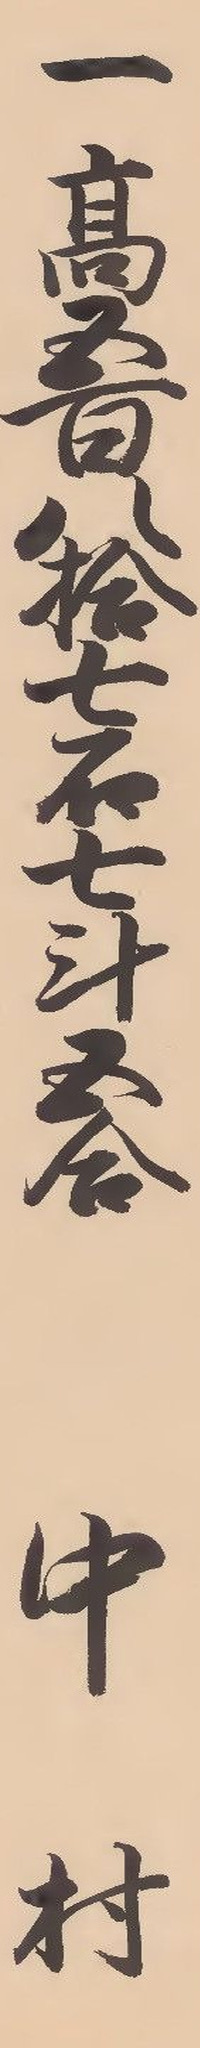一高五百八拾七石七斗五合中村
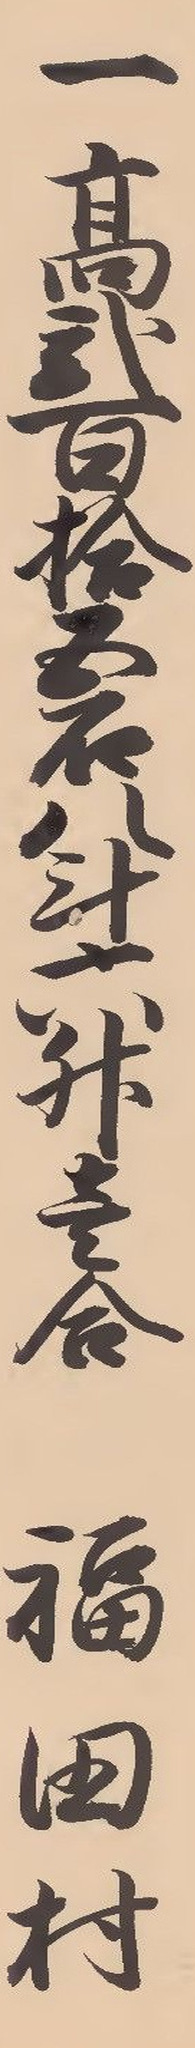一高弐百拾五石八斗六升壱合福田村
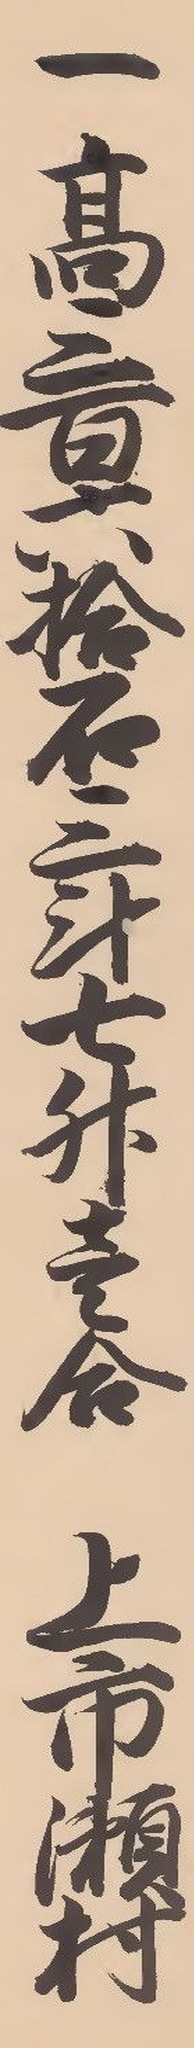一高三百六拾石三斗七升壱合上市瀬村
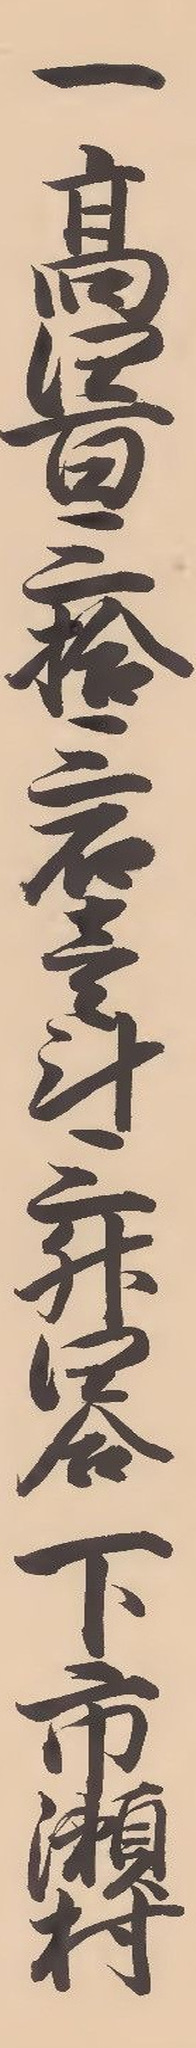一高四百三拾三石壱斗三升四合下市瀬村
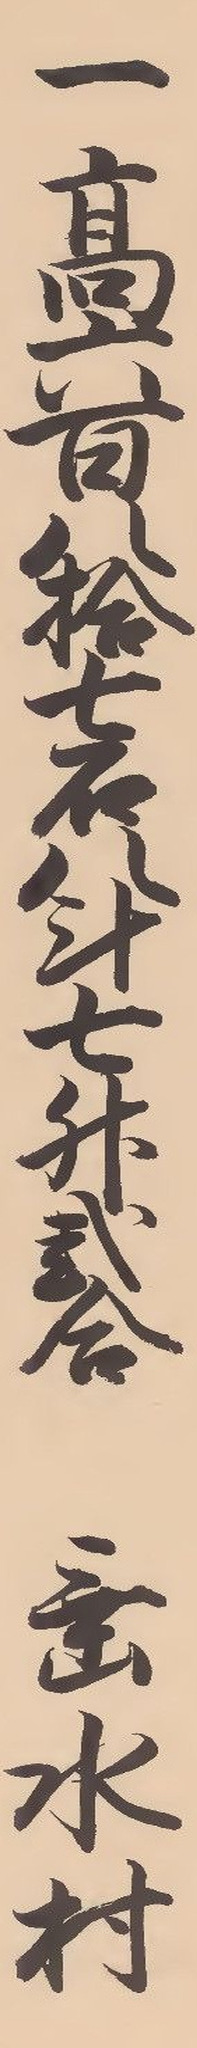一高六百八拾七石八斗七升弐合垂水村
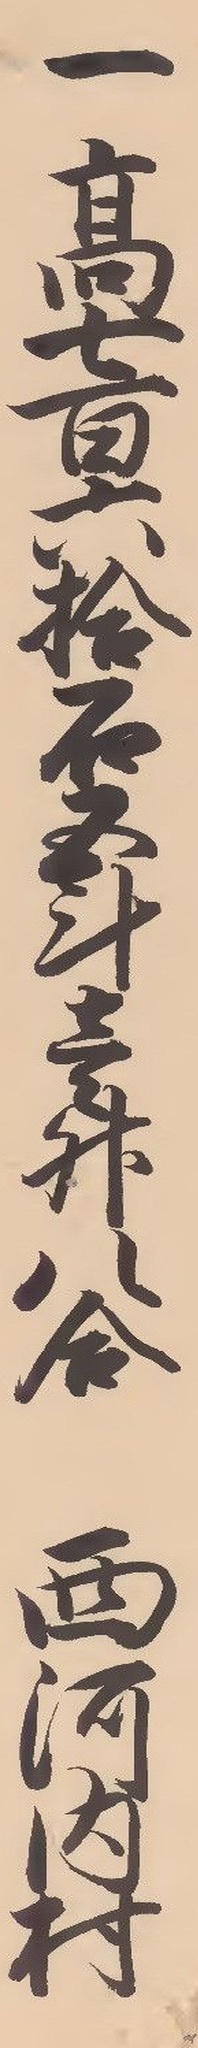一高七百六拾石五斗壱升八合西河内村

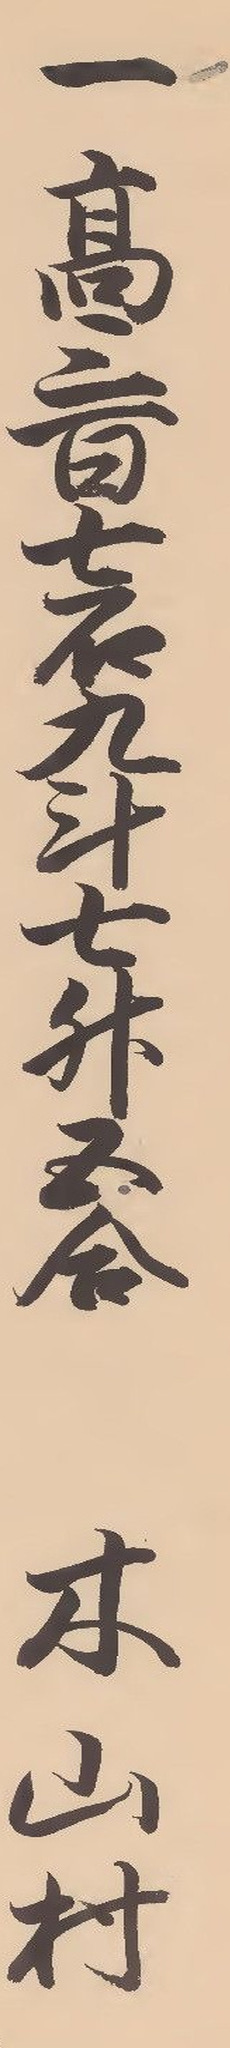一高三百七石九斗七升五合木山村
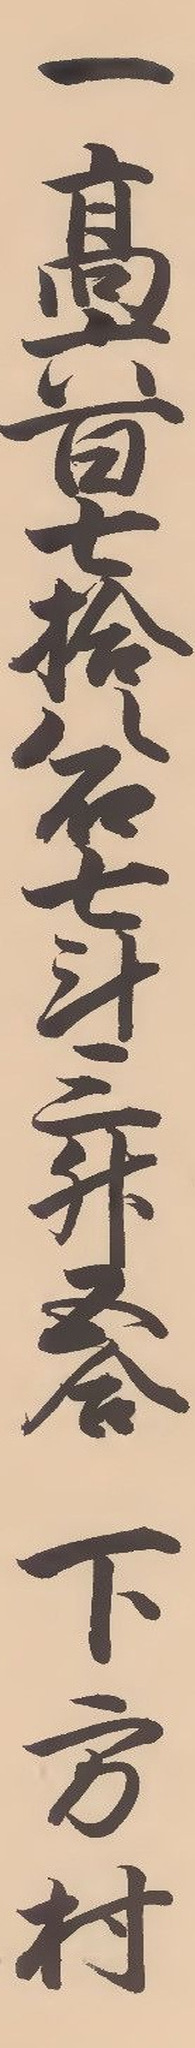一高六百七拾八石七斗三升五合下方村
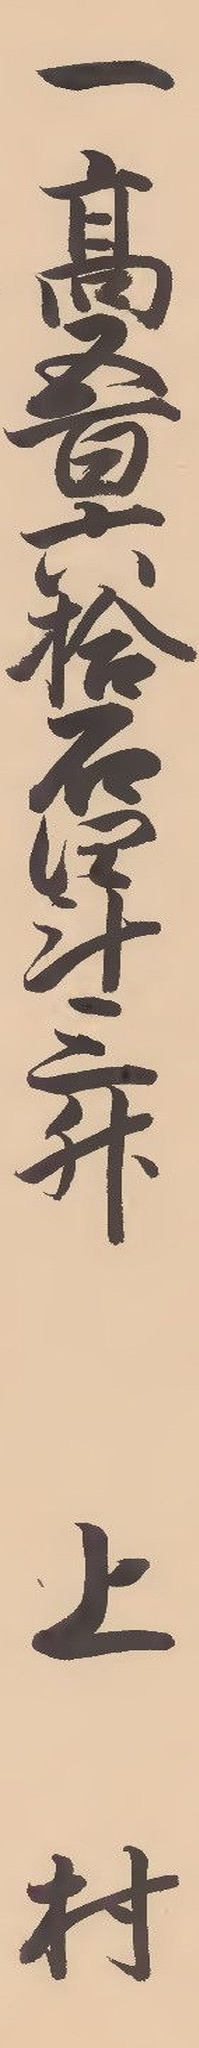一高五百六拾石四斗三升上村
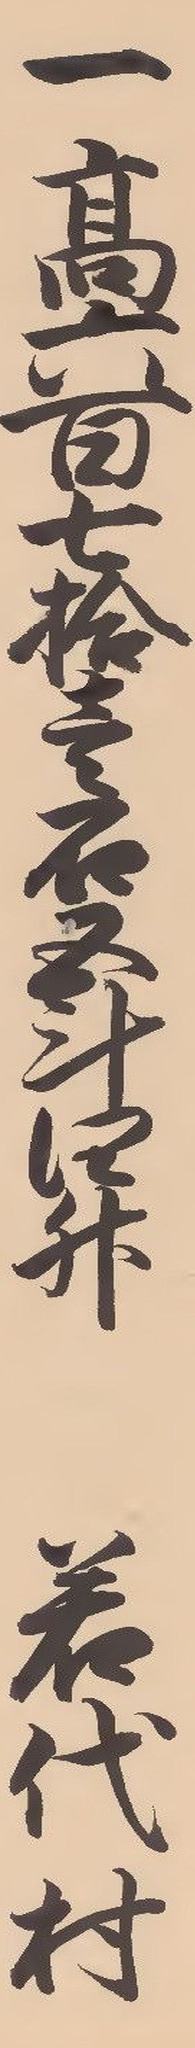一高六百七拾壱石五斗四升若代村
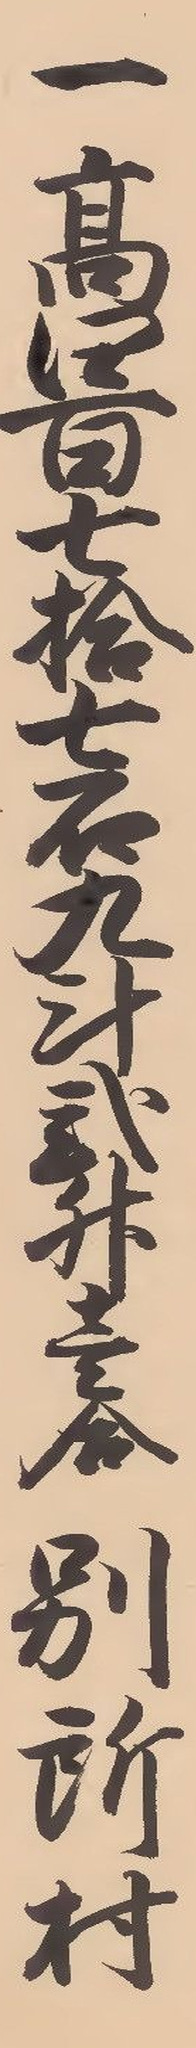一高四百七拾七石九斗弐升壱合別所村
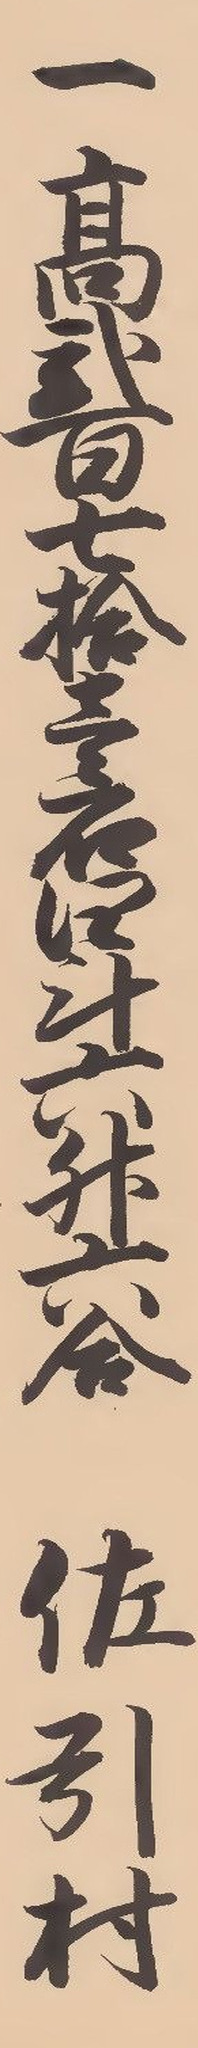一高弐百七拾壱石四斗六升六合佐引村
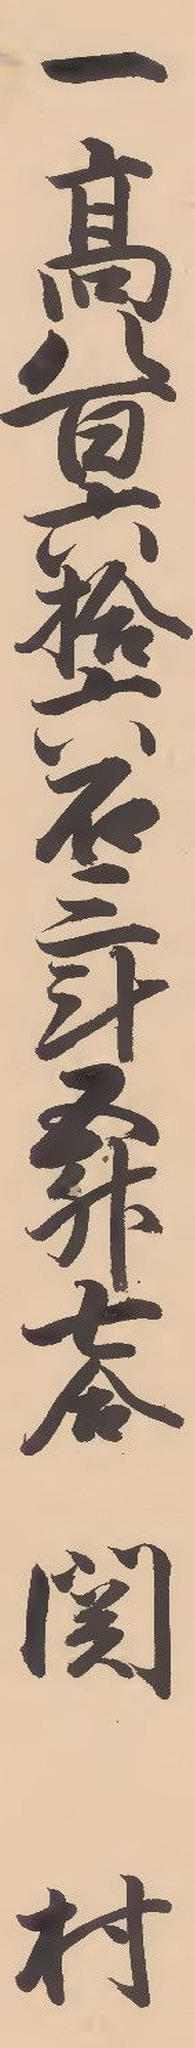一高八百六拾六石三斗五升七合関村

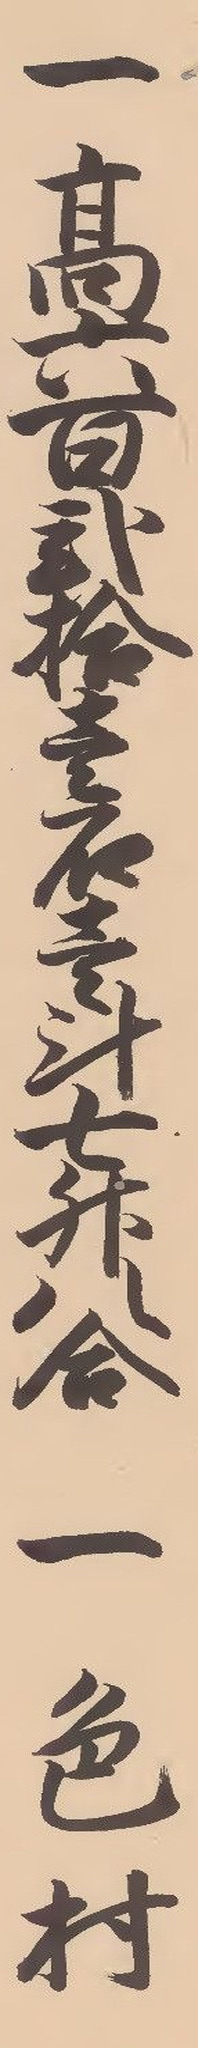一高六百弐拾壱石壱斗七升八合一色村
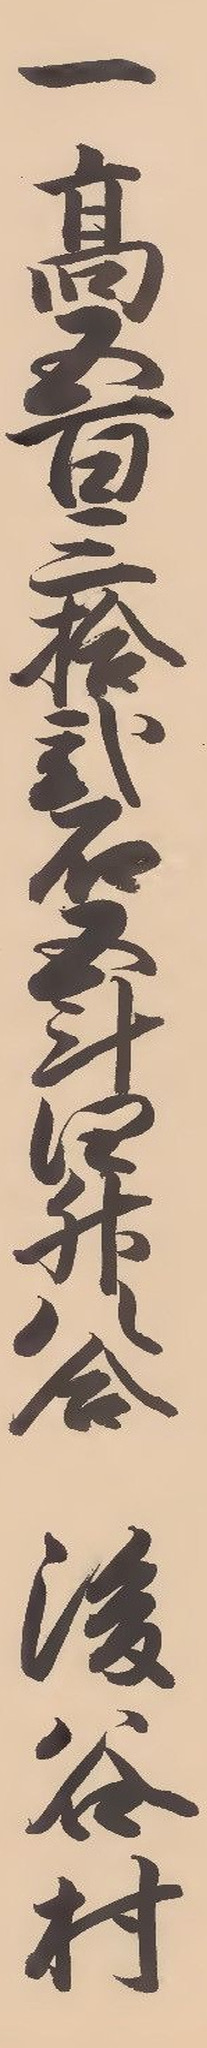一高五百三拾弐石五斗四升八合後谷村
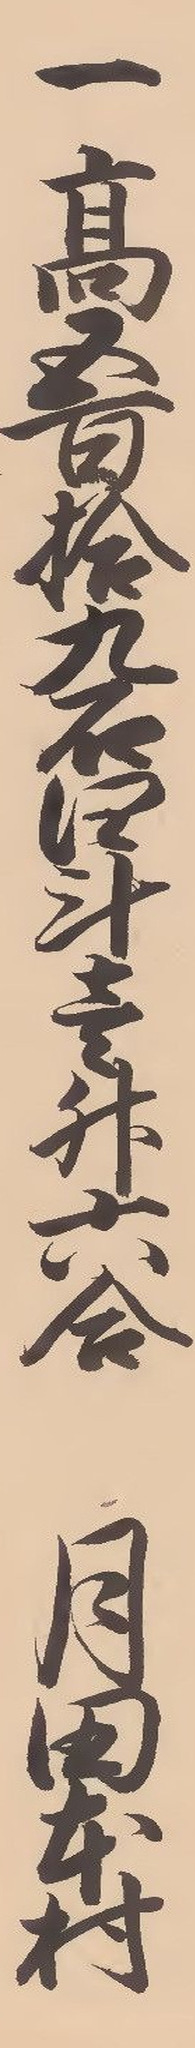一高五百拾九石四斗壱升六合月田本村
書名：美作国郷帳
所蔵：国立公文書館 National Archives of Japan
